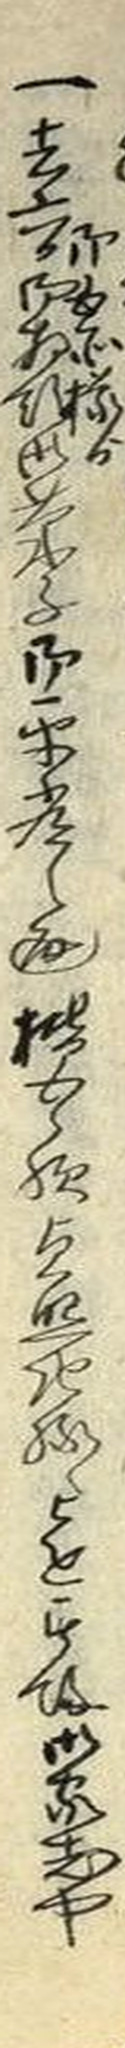一去六日御五所様ゟ御拝領御菓子御平常之通楷五郎様貞照院様へ被進其余御家老中
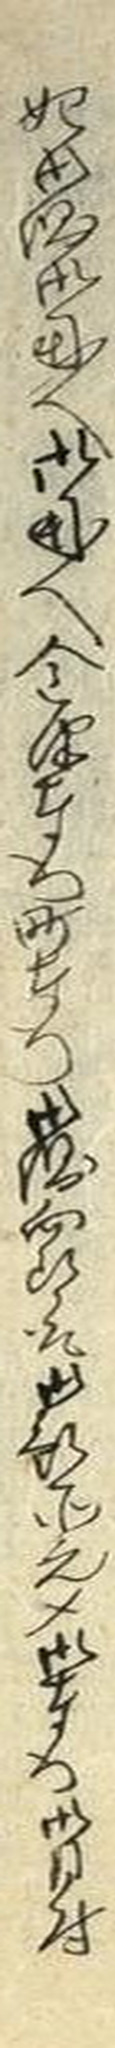始御側御用人御用人金津奉行町奉行御側向頭取御預所元〆御奉行御目付
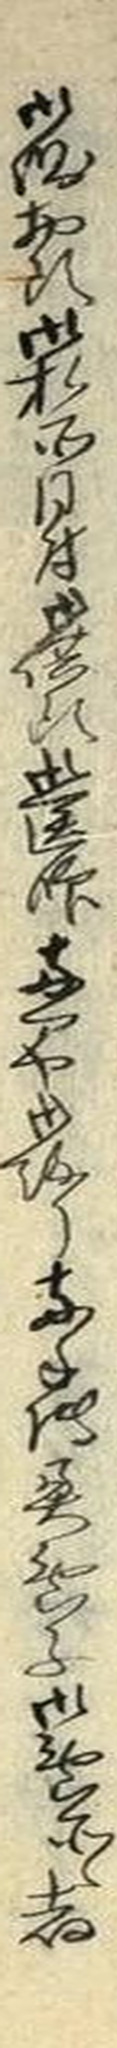御側物頭御札所目付御供頭御医師両部や御帰り両手伝奥台子御台所之者
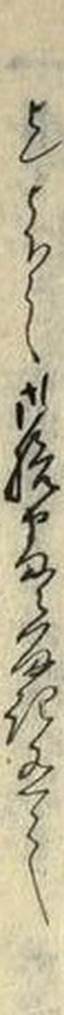迄被下之御膳番之留記有之
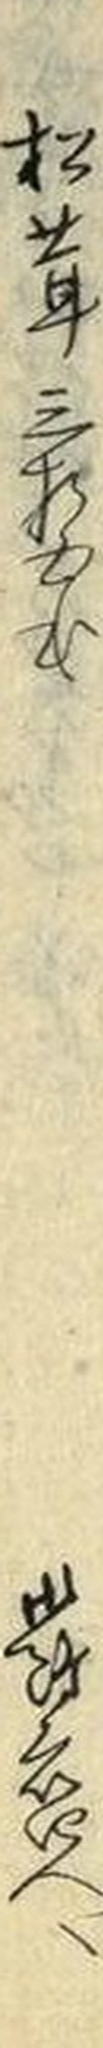松茸三拾五本御附衆四人へ
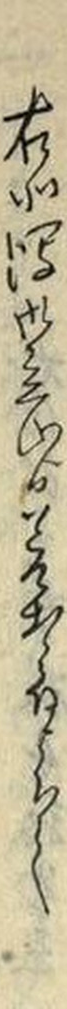右北潟御立山ゟ差出候ニ付被下之
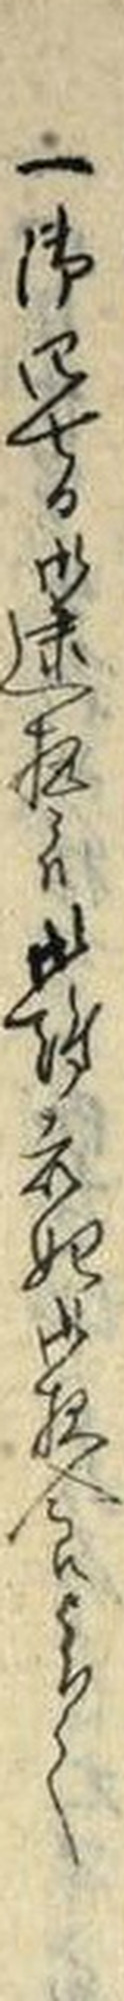一御四七日御逮夜ニ付御附衆始御夜食被下之

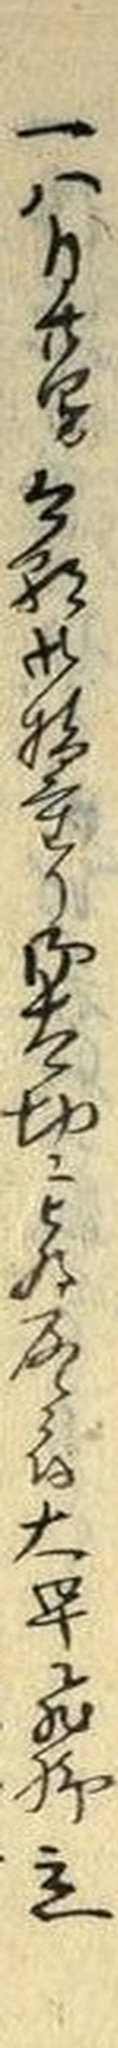一八月廿四日今朝御指重り御太切ニ被為及候ニ付大早飛脚立
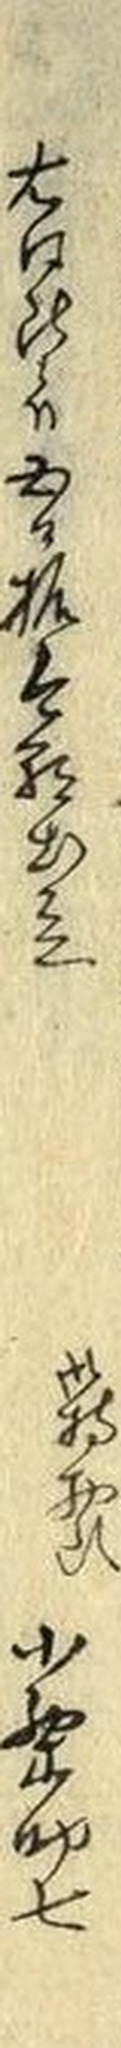右同断ニ付五日振今朝出立御持物頭小栗助七
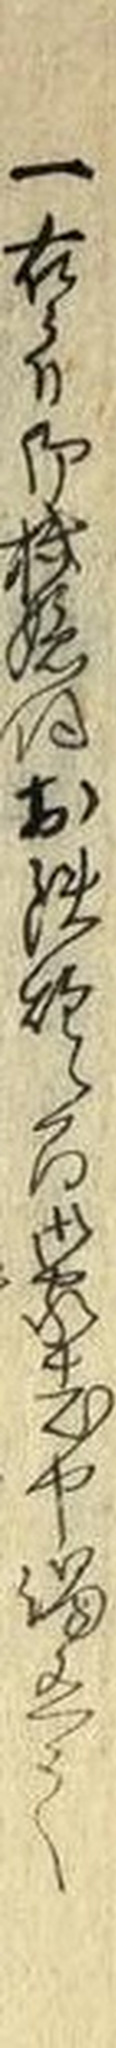一右ニ付御機嫌伺於鉄砲之間御家老中謁有之
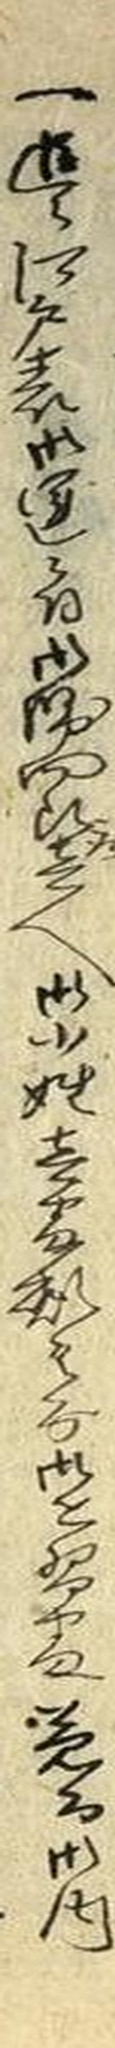一追々江戸表御運ニ付御側向頭取壱人御小姓壱番頬方ゟ御近習番兼而御内
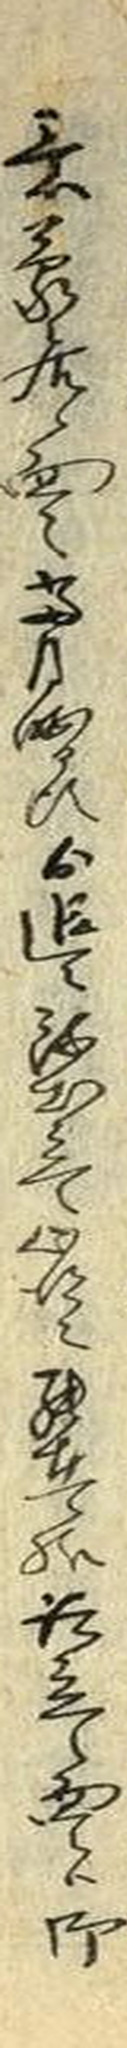意蒙居候面々当月晦日頃ゟ追々致出立候心得ニ罷在候様跡立之面々ハ御
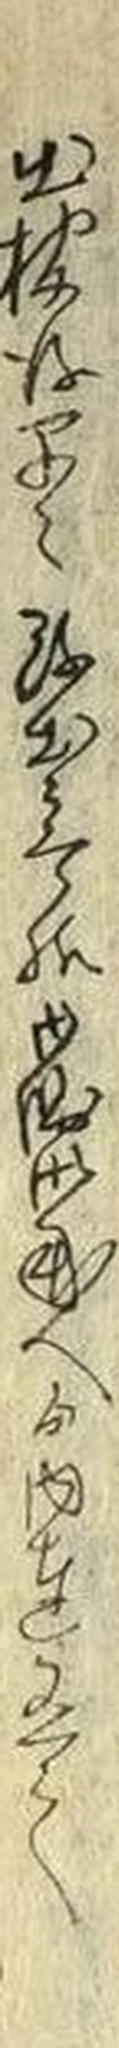出棺後早々致出立候様御側御用人ゟ内達有之
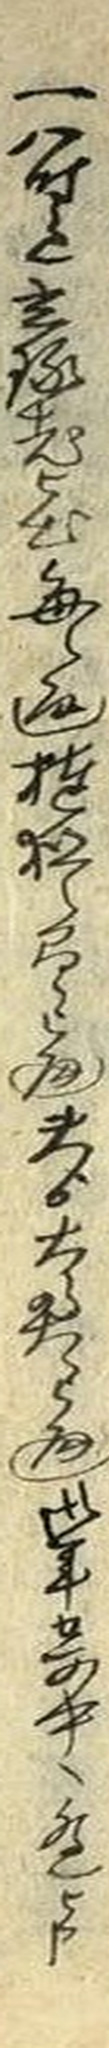一八時過玄琢老被出毎々通韃靼之間被通夫ゟ大奥被通御年寄中へ逢被申
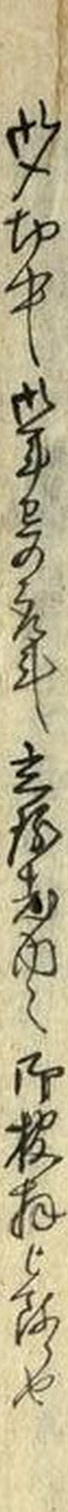御〆切中御年寄取斗玄琢老内々御棺拝被改候由
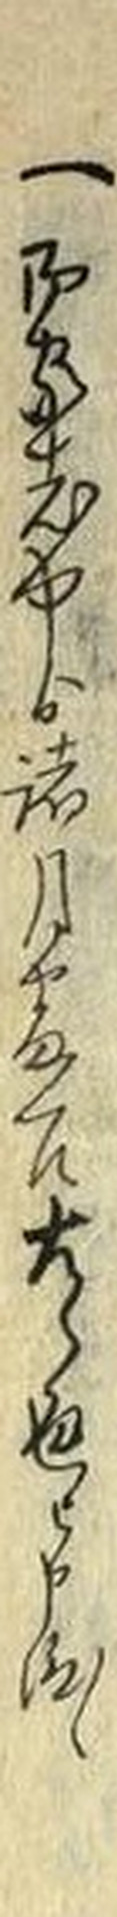一御家老中ゟ諸月番召左之通被申渡候
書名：少傅日録抄（斉善付側向頭取日記、江戸并道中、初入在国、逝去後…
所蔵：福井県文書館 Fukui Prefectural Archives
